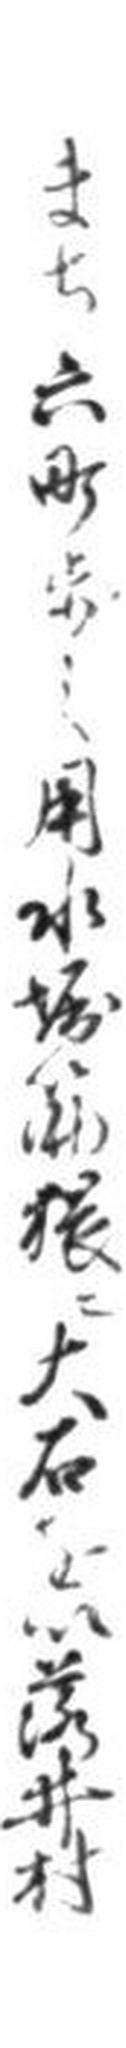まち六町歩之用水堀筋猥ニ大石を以落井村
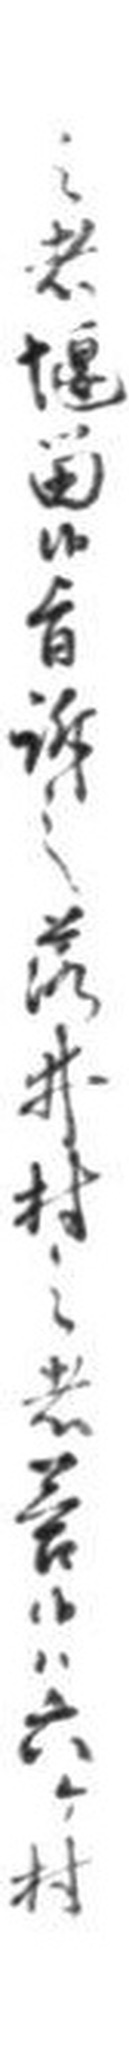之者堰留候旨訴之落井村之者答候ハ六ケ村
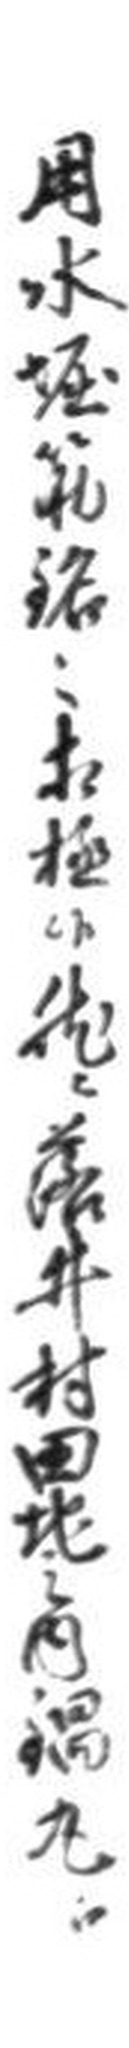用水堀筋銘々相極候然ニ落井村田地之内鍋丸江
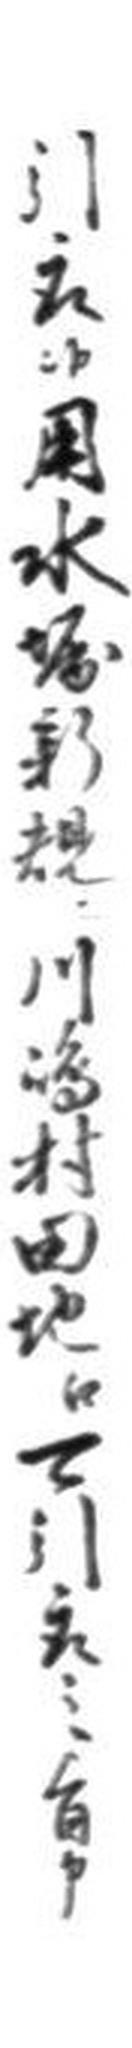引取候用水堀新規ニ川嶋村田地江可引取之旨申
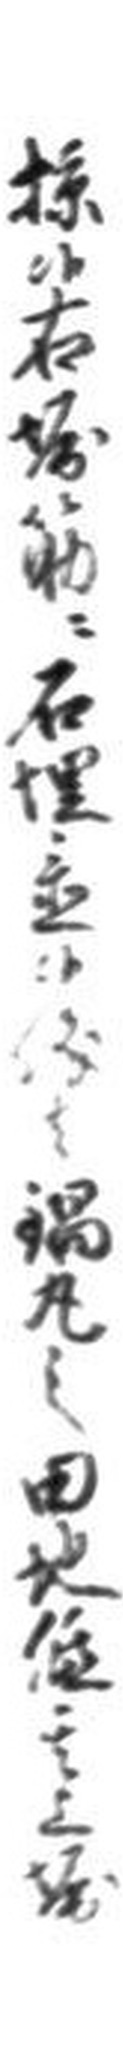掠候右堀筋ニ石埋置候儀者鍋丸之田地低其上堀
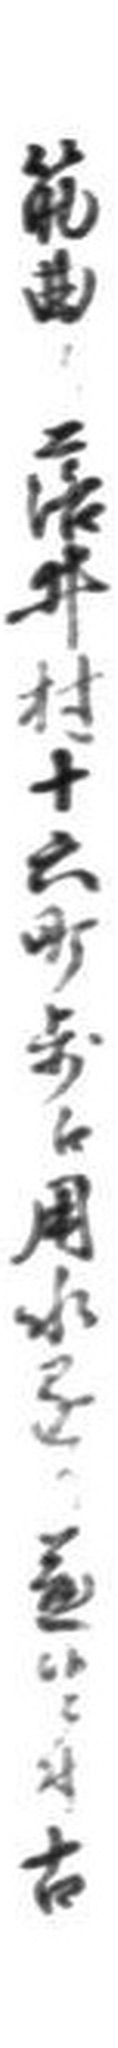筋曲り落井村十六町歩江用水懸り兼候ニ付古
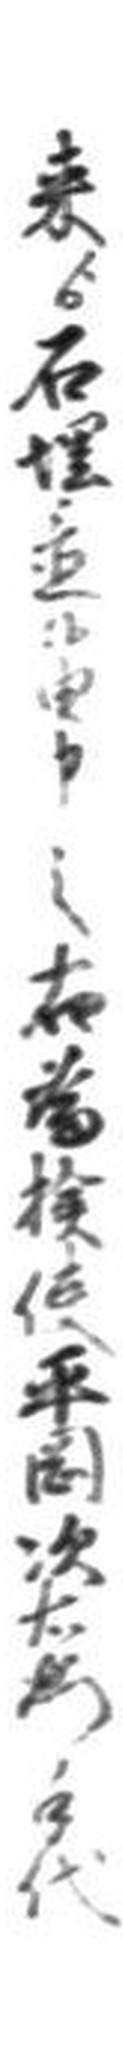来ゟ石埋置候由申之右為検使平岡次右衛門手代
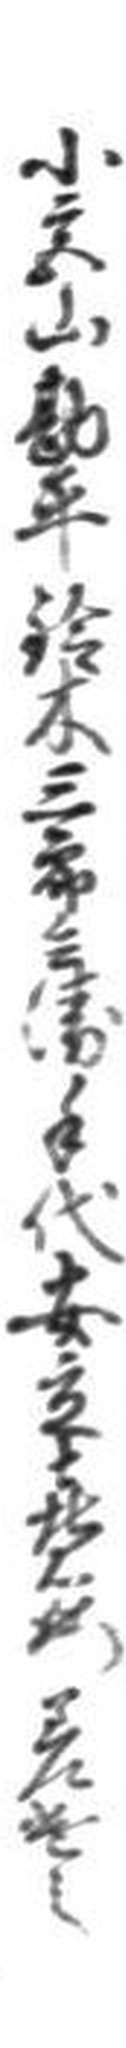小宮山勘平鈴木三郎兵衛手代安立喜右衛門差遣之
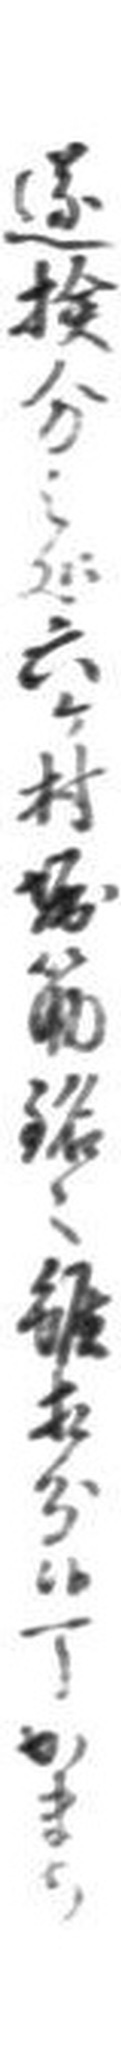遂検分之処六ケ村堀筋銘々難相分候丁かまち
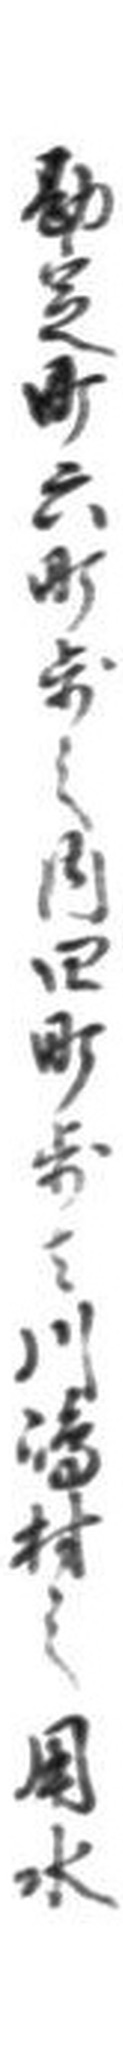勘定町六町歩之内四町歩者川嶋村之用水
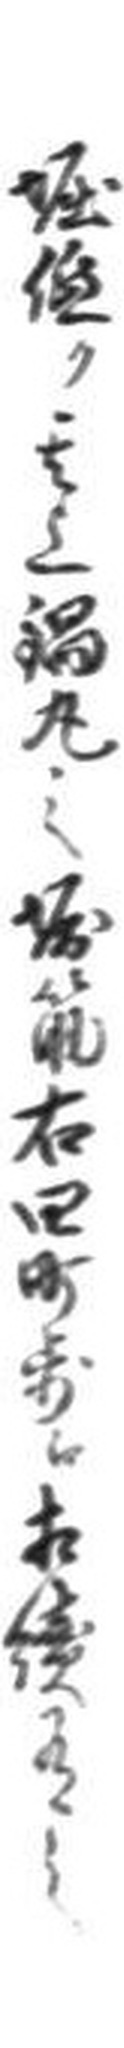堀低ク其上鍋丸之堀筋右四町歩江相続有之

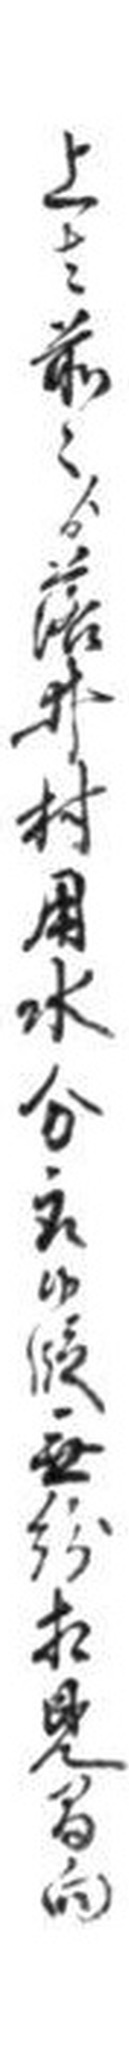上者前々ゟ落井村用水分取候段無紛相見間向
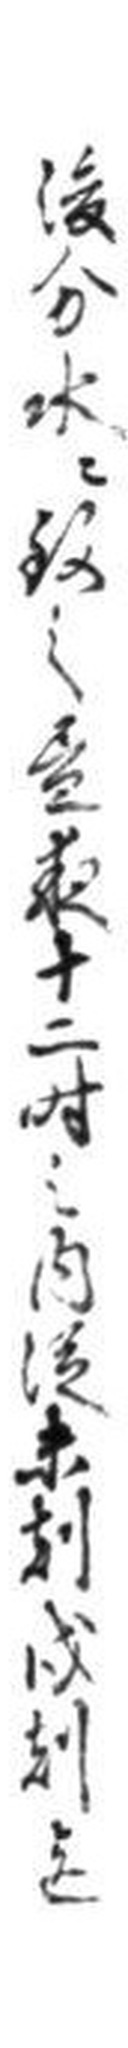後分水ニ致之昼夜十二時之内従未刻戌刻迄
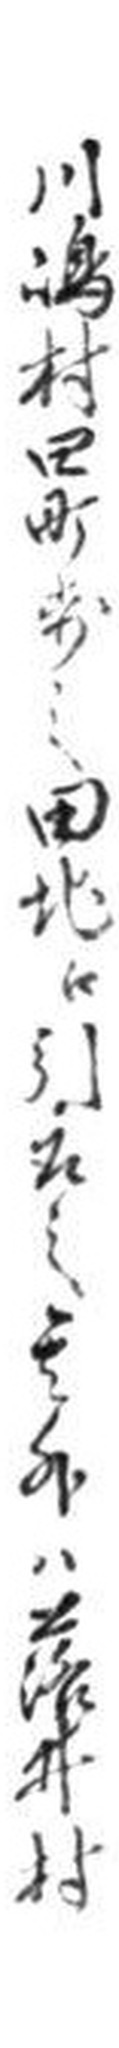川嶋村四町歩之田地江引取有之其外ハ落井村
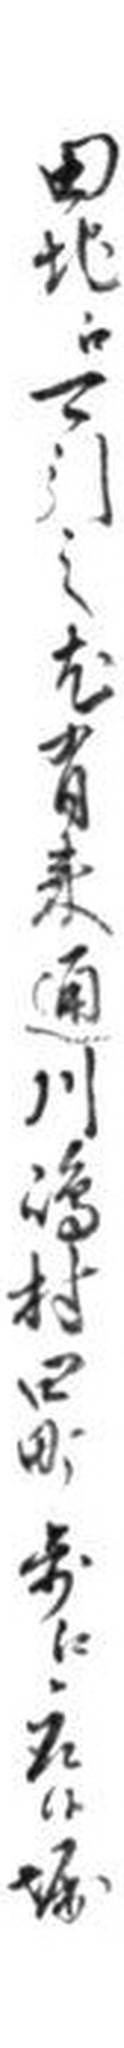田地江可引之尤有来通川嶋村四町歩江取候堀
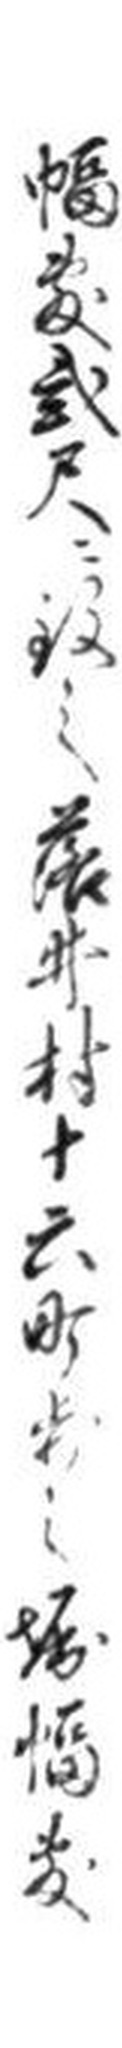幅敷弐尺ニ致之落井村十六町歩之堀幅敷
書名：家譜 二十二 吉品公 従元禄十五年到同十六年
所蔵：福井県文書館 Fukui Prefectural Archives
